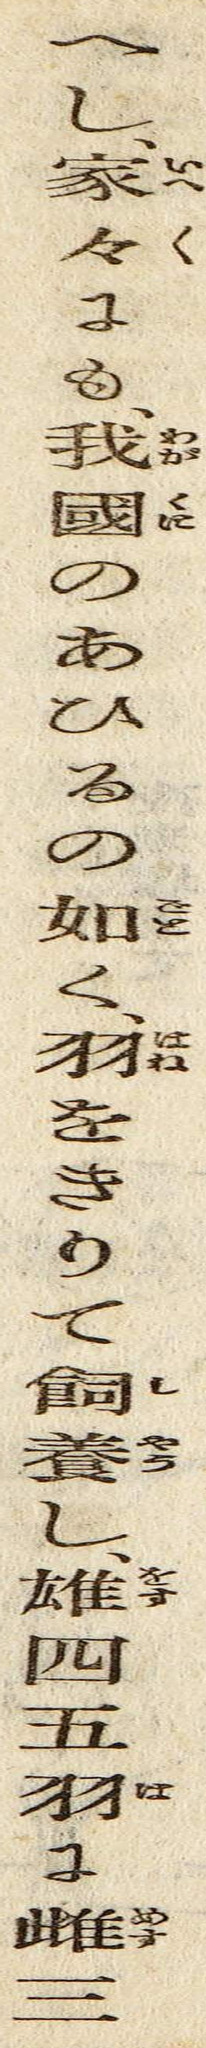へし、家々にも、我国のあひるの如く、羽をきりて飼養し、雄四五を羽に雌三
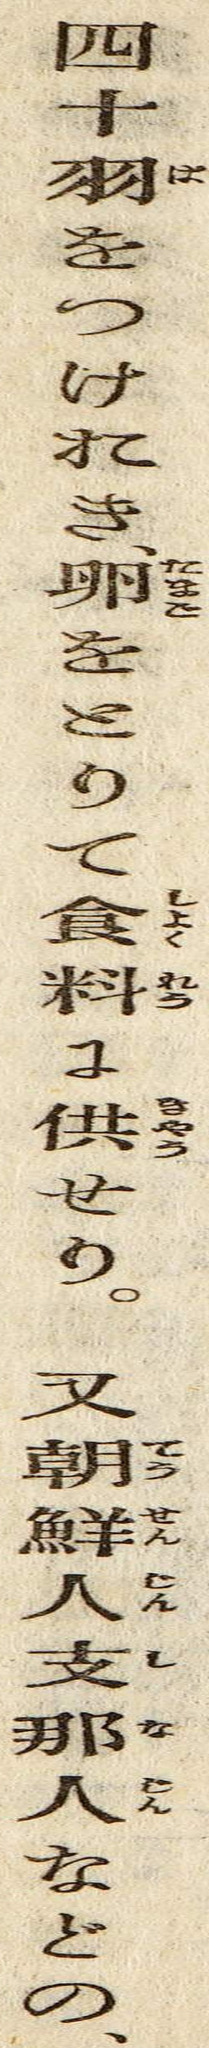四十羽をつけおき、卵をとりて食料に供せり。又朝鮮人支那人などの、

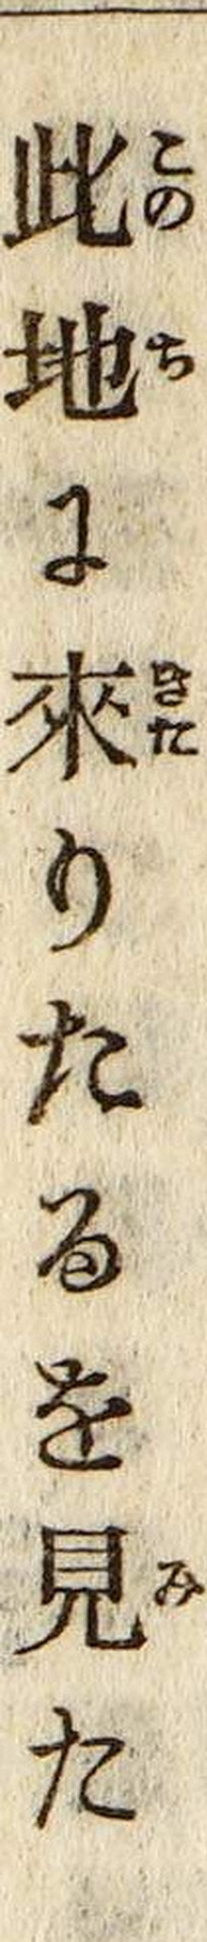此地に来りたるを見た
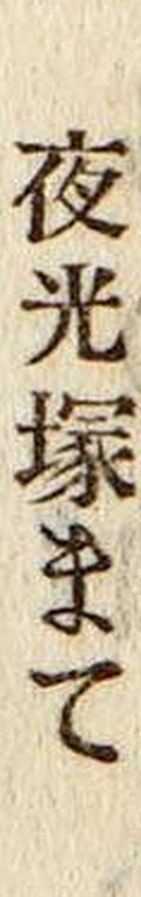夜光塚まて
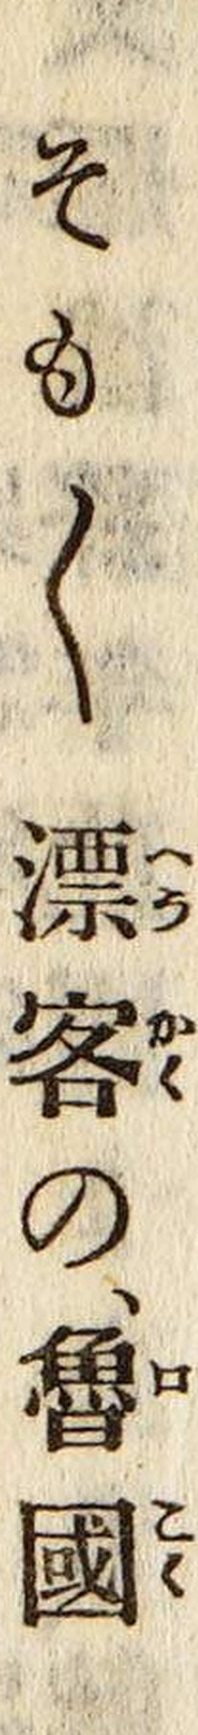そも〳〵漂客の、魯国
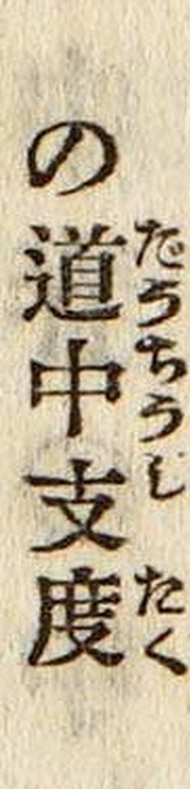の道中支度
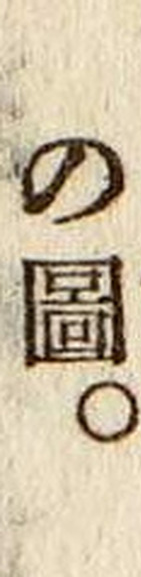の図。
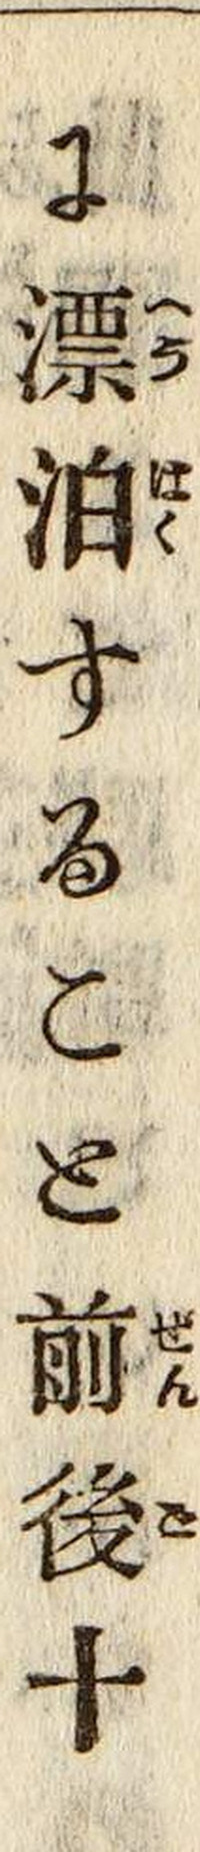に漂泊すること前後十
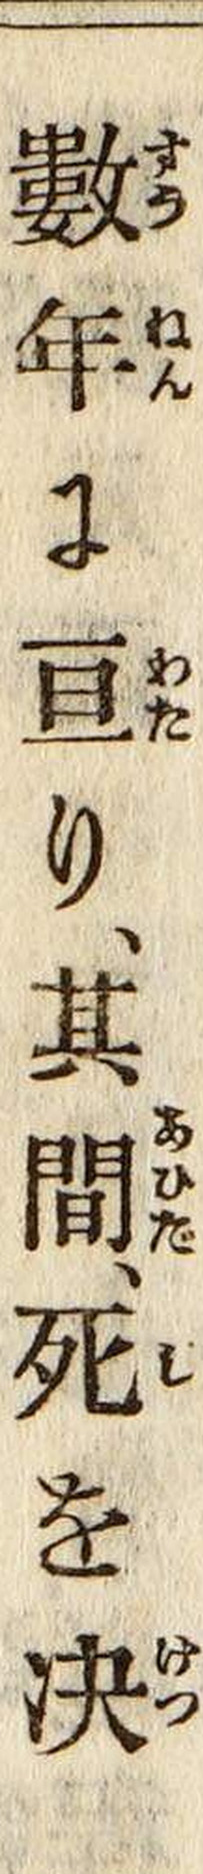数年に亘り、其間、死を決
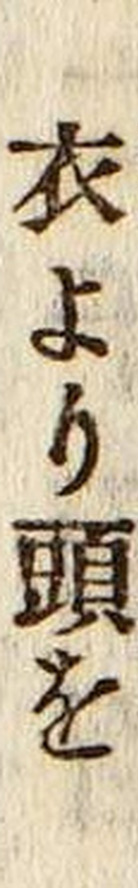衣より頭を
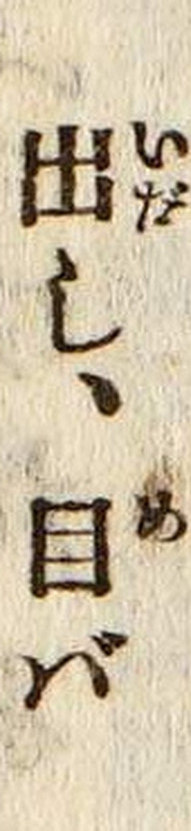出し、目ば
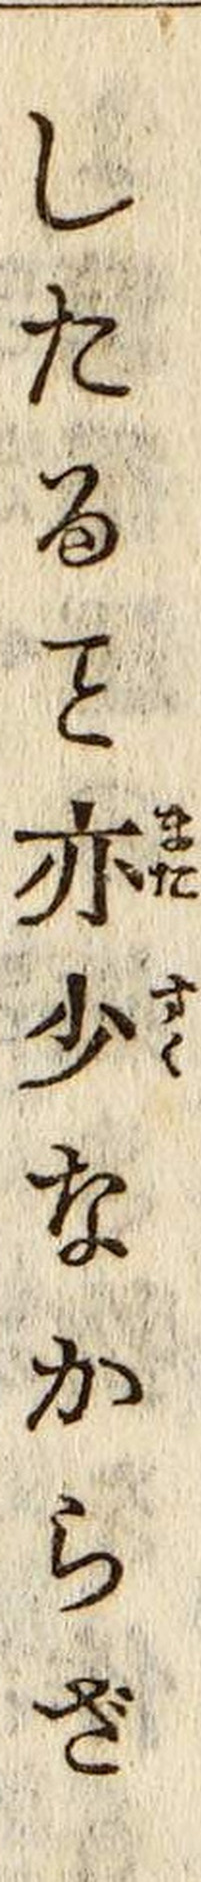したること亦少なからざ
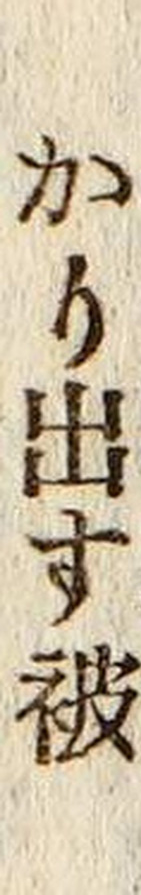かり出す被
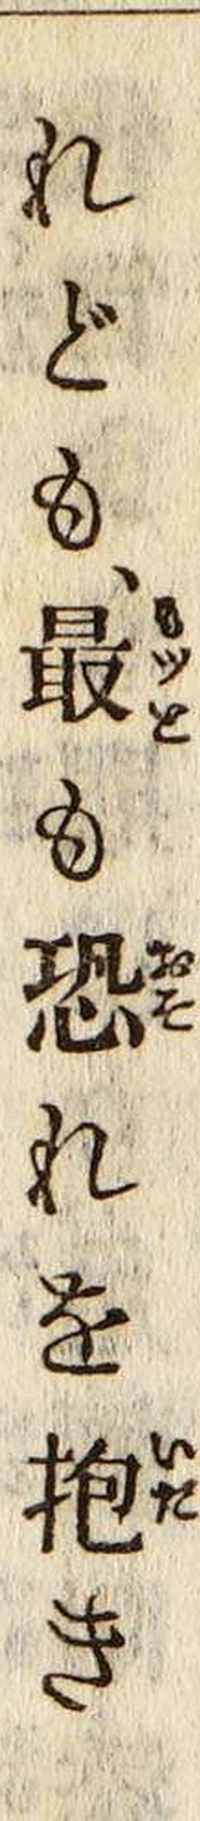れとも、最も恐れを抱き
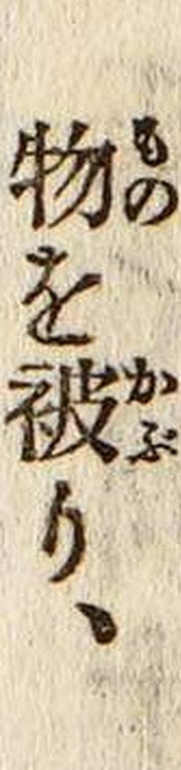物を被り、
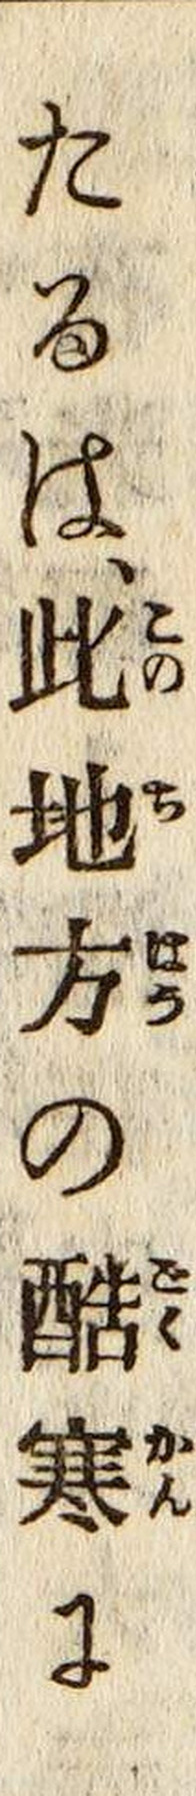たるは、此地方の酷寒に
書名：日本漂流譚
